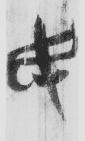民
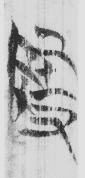{隓又}
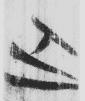乏
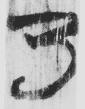乃
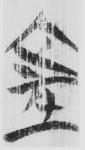{宀㞷}
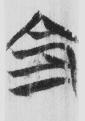命
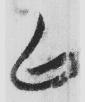㠯（以）
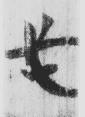弋
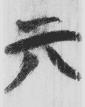亓
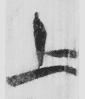上
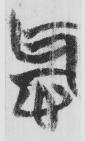怠
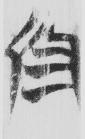於
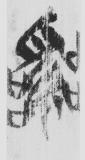{𤔔㗊}
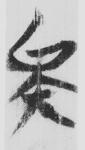矣
